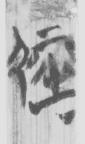{尸几土}
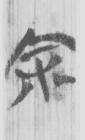余
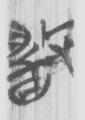敢
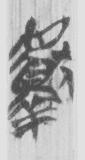獻
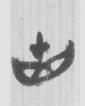鬯
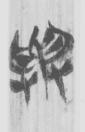與
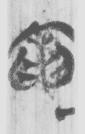龜
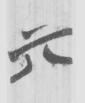亓
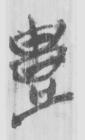豊
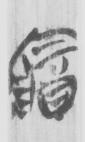𫳼
